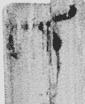氏（是）
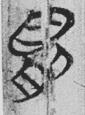{胃刀}（謂）
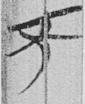不
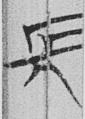長
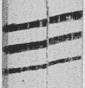三
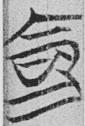命
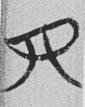四
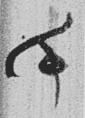氏（是）
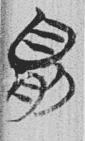{胃刀}（謂）
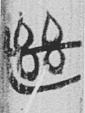○（絕）
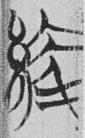○（輟）
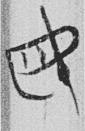母
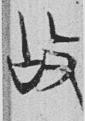○（抽）
